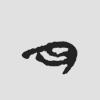月
